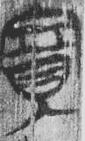賽
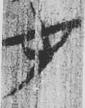才（在）
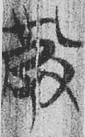○（波）
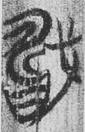○（濤）
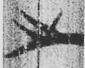之
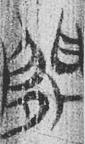○（閒）
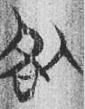咎（舅）
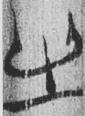生（甥）
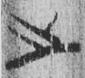之
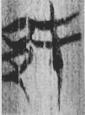邦
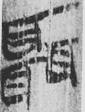聶（攝）
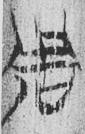周
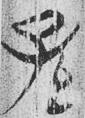子
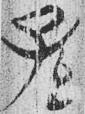孫
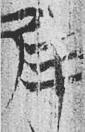隹（唯）
